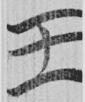王
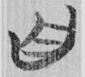自
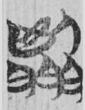臨
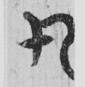卜
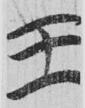王
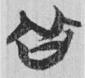○（嚮）
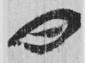日
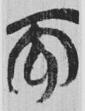而
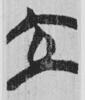立
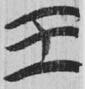王
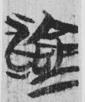滄（汗）
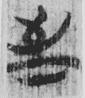至
